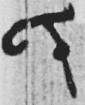氏（是）
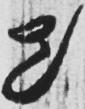也
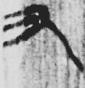又（有）
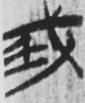城（成）
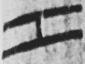工（功）
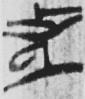者
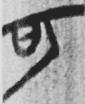可（何）
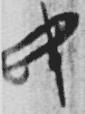女（如）
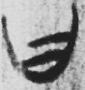曰
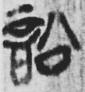訟
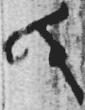氏（是）
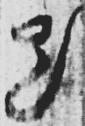也
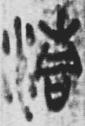清
